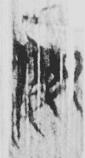○（海）
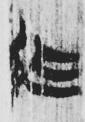於
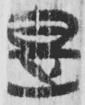是
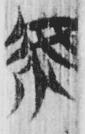{虍介}（乎）
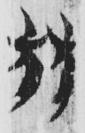並
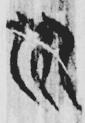州
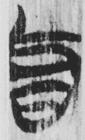○（始）
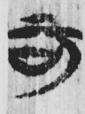可
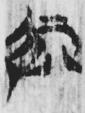凥（處）
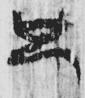也
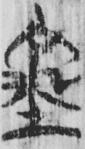○（禹）
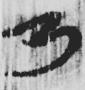乃
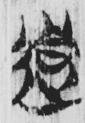迵（通）
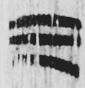三
